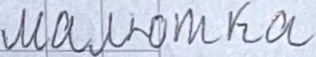малютка
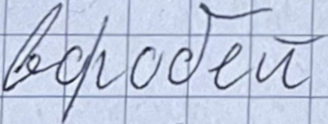воробей
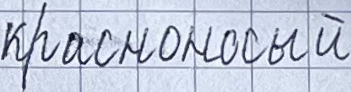красноносый
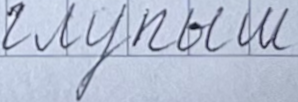глупыш
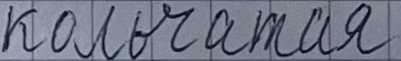кольчатая
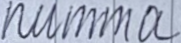питта
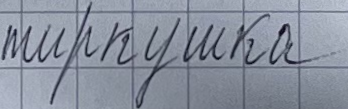тиркушка
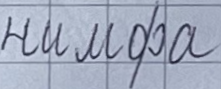нимфа
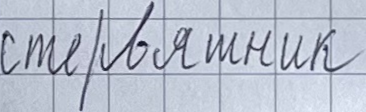стервятник
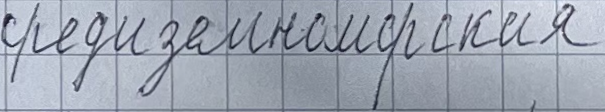средиземноморская
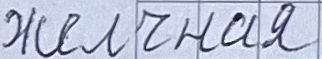желчная
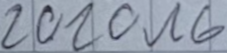гоголь
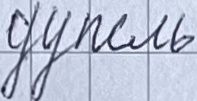дупель
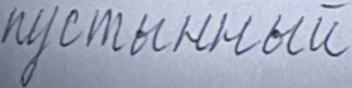пустынный
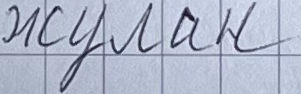жулан
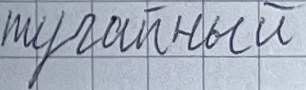тугайный
